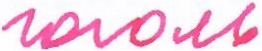гоголь
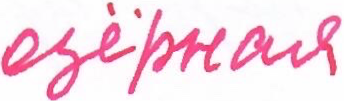озёрная
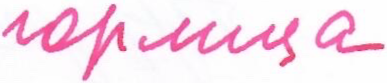горлица
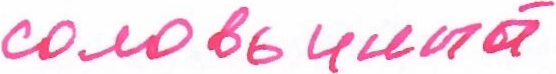соловьиный
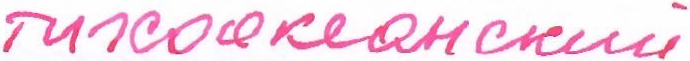тихоокеанский
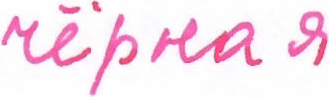чёрная
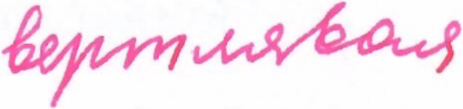вертлявая
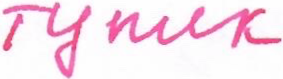тупик
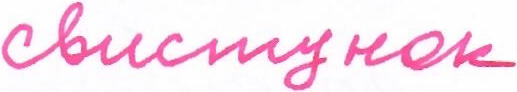свистунок
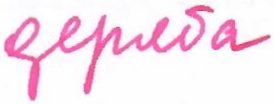деряба
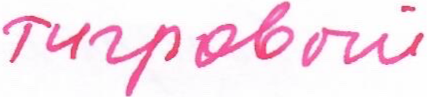тигровый
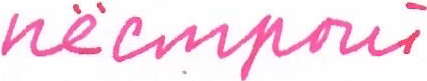пёстрый
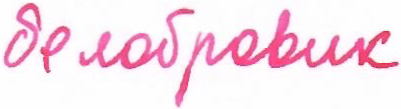белобровик
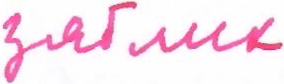зяблик
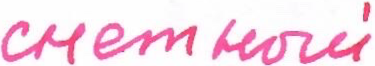снежный
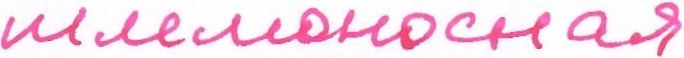шлемоносная
